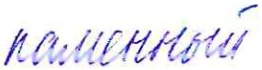паменный
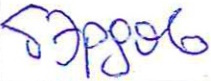бэрдов
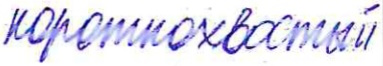короткохвостый
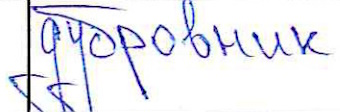дубровник
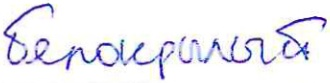белокрылый
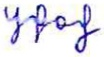удод
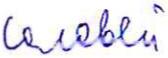соловей
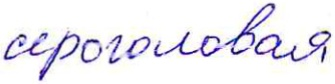сероголовая
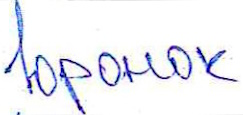воронок
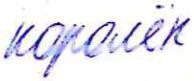королёк
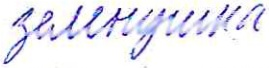зеленушка
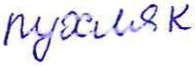пухляк
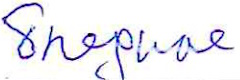бледная
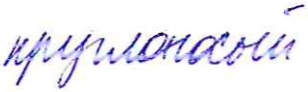круглоносый
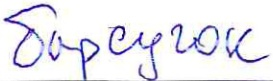барсучок
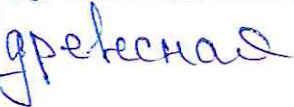древесная
